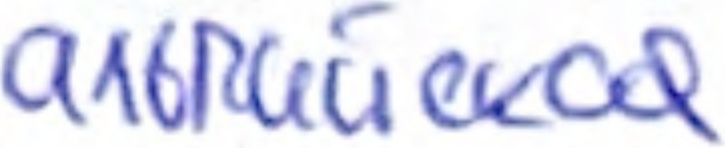альпийская
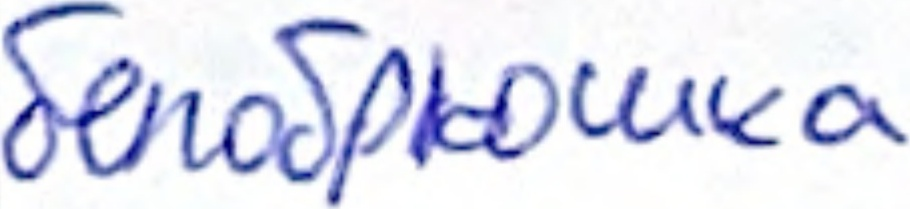белобрюшка
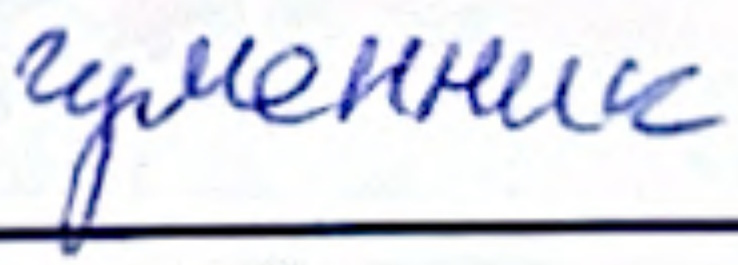гуменник
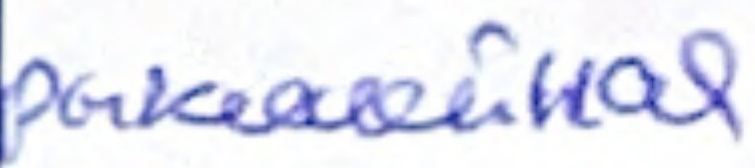рыжешейная
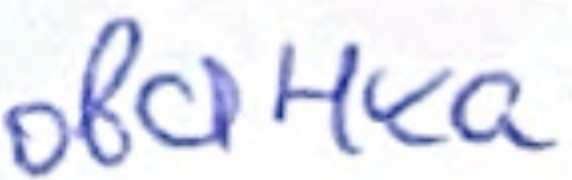овсянка
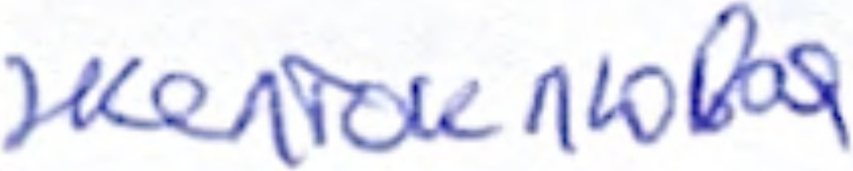желтоклювая
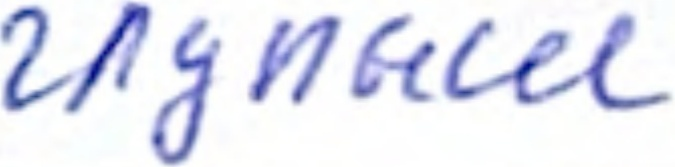глупыш
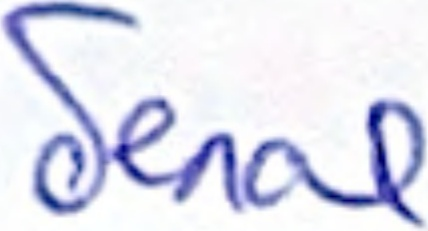белая
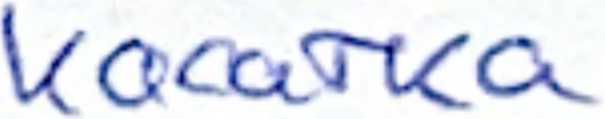касатка
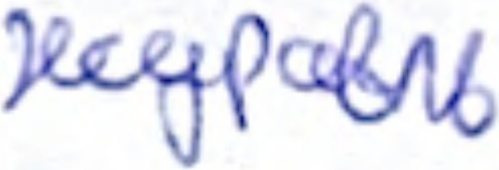журавль
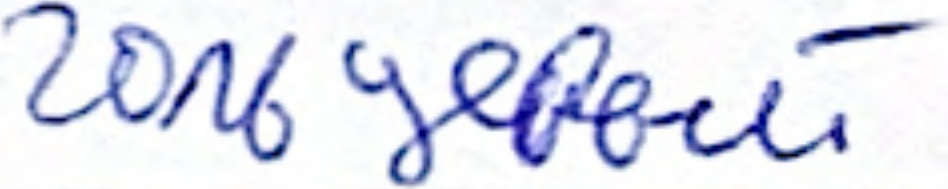гольцевый
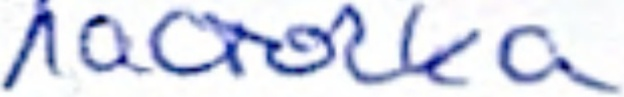ласточка
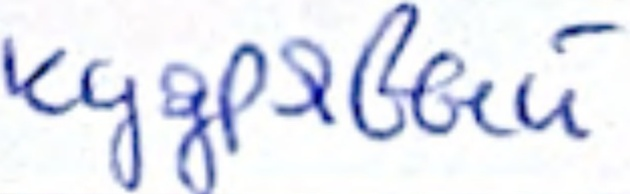кудрявый
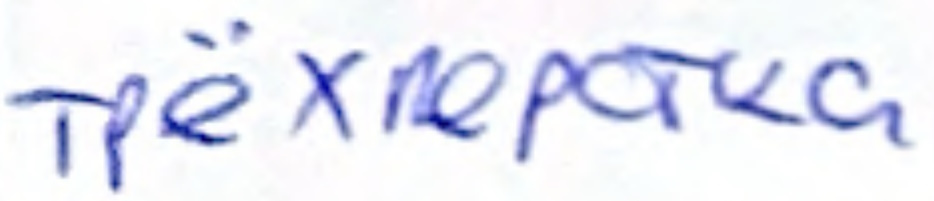трёхперстка
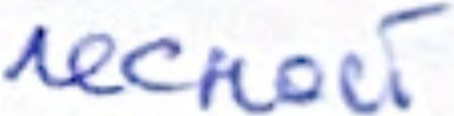лесной
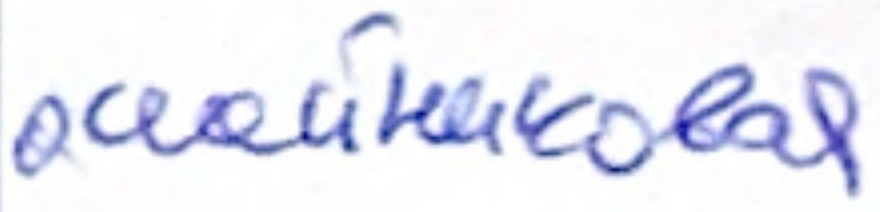ошейниковая
